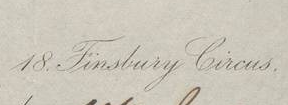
18. Finsbury Circus.
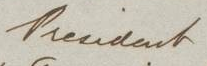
President
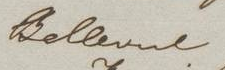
Bellevue
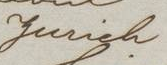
Zurich
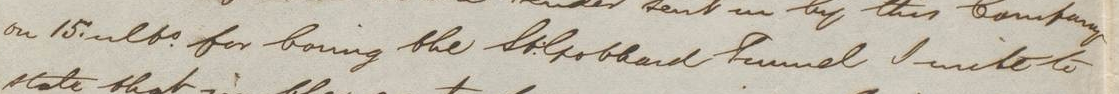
on 15. ulto for boring the St. Gothard Tunnel I write to
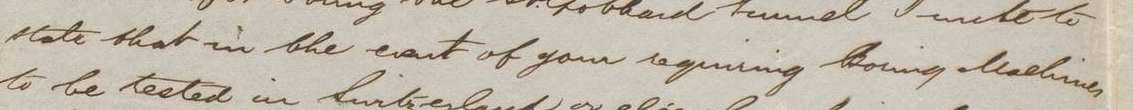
state that in the event of your requiring Boring Machines
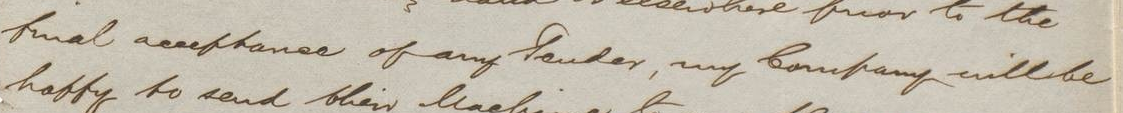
final acceptance of any Tender, my Company will be
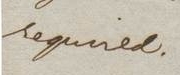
required.
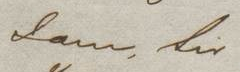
I am, Sir
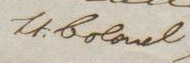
Lt: Colonel
